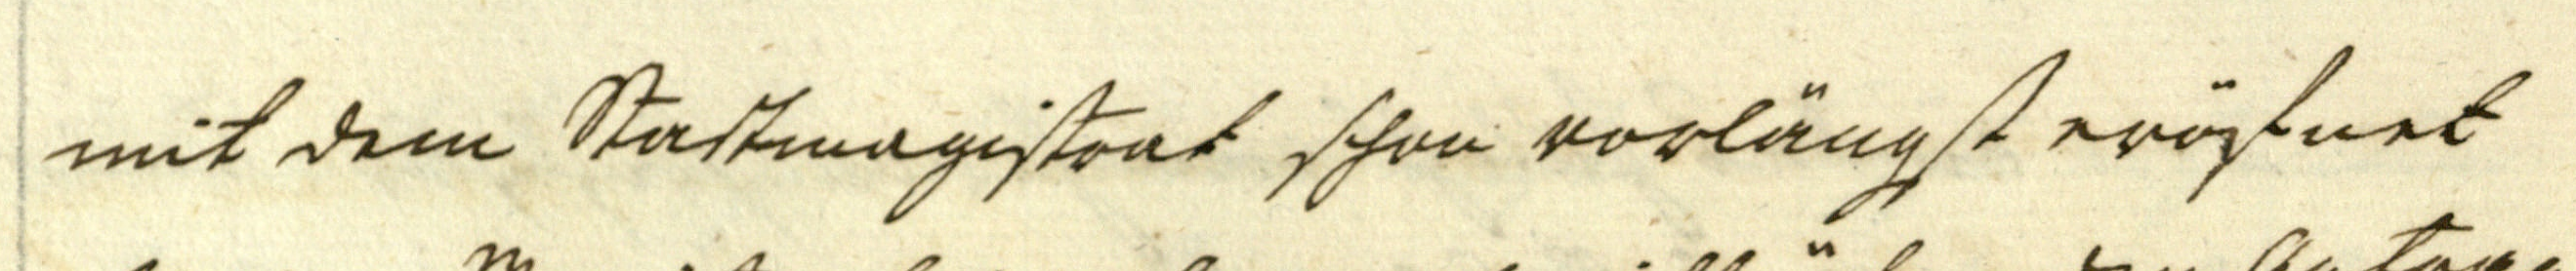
mit dem Stadtmagistrat schon vorlängst eröfnet
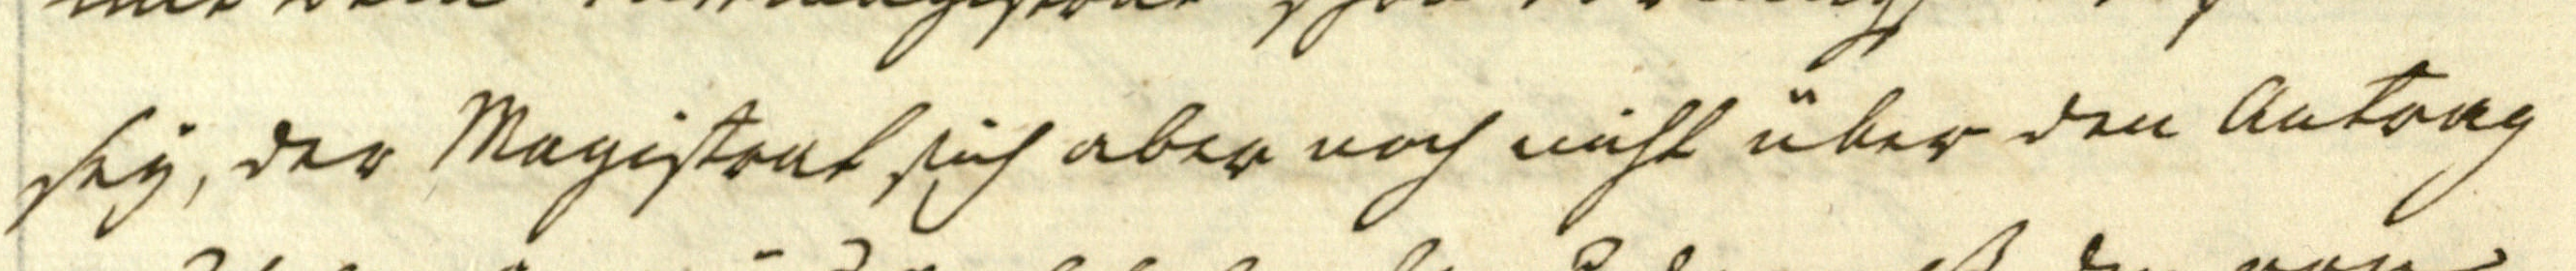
seÿ, der Magistrat sich aber noch nicht über den Antrag
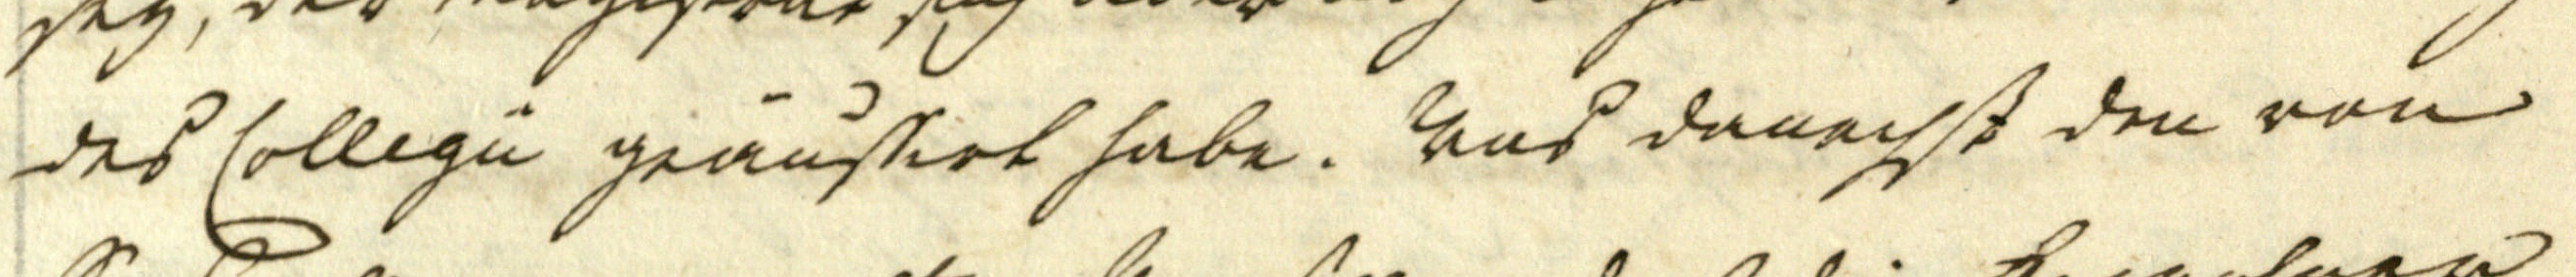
des Collegii geäussert habe. Was danechst den von
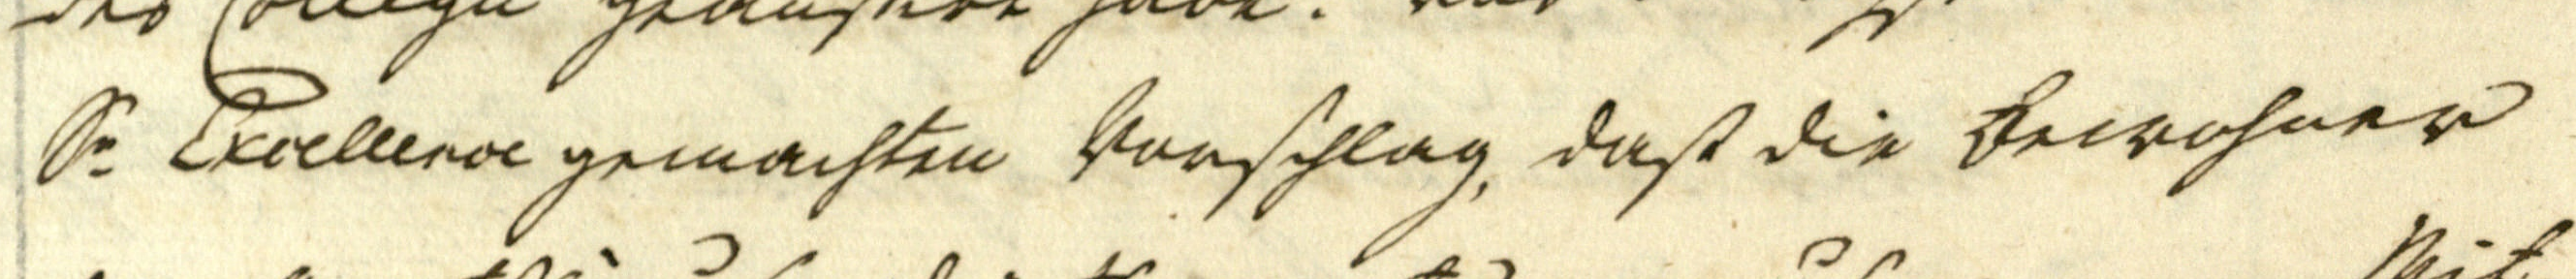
Sr Excellence gemachten Vorschlag, daß die Bewohner
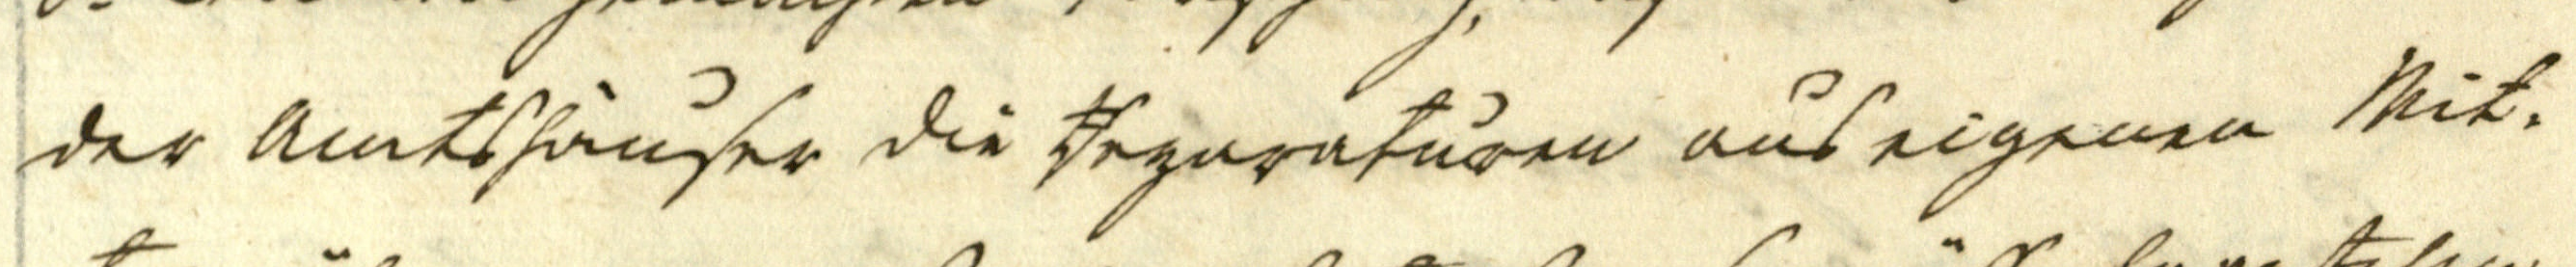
der Amtshäuser die Reparaturen aus eigenen Mit¬
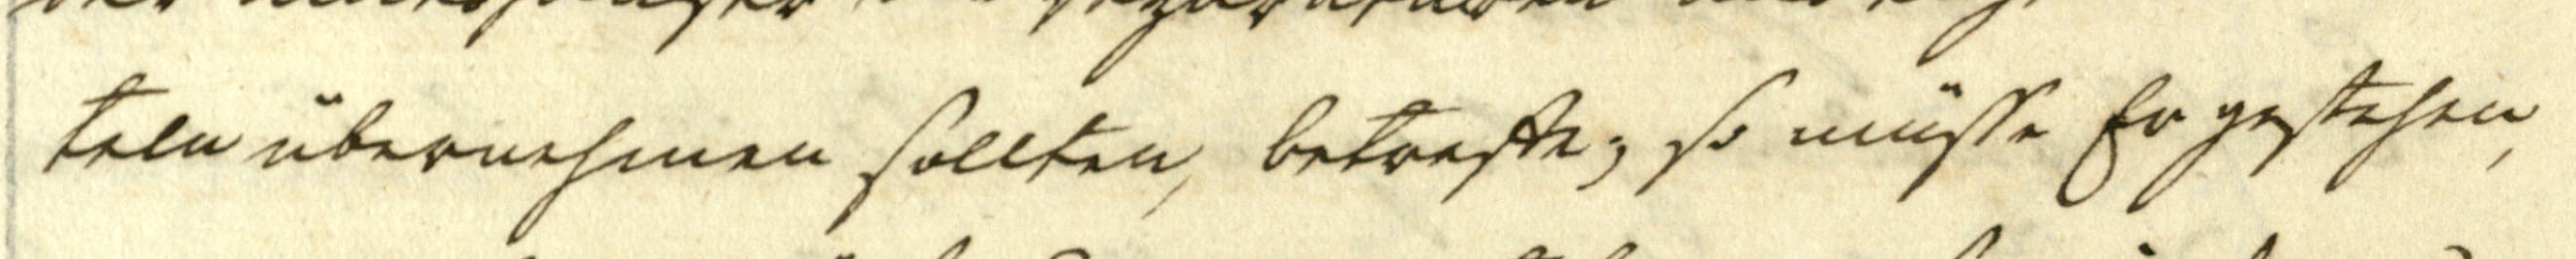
teln übernehmen sollten, betreffe, so müsse Er gestehen,
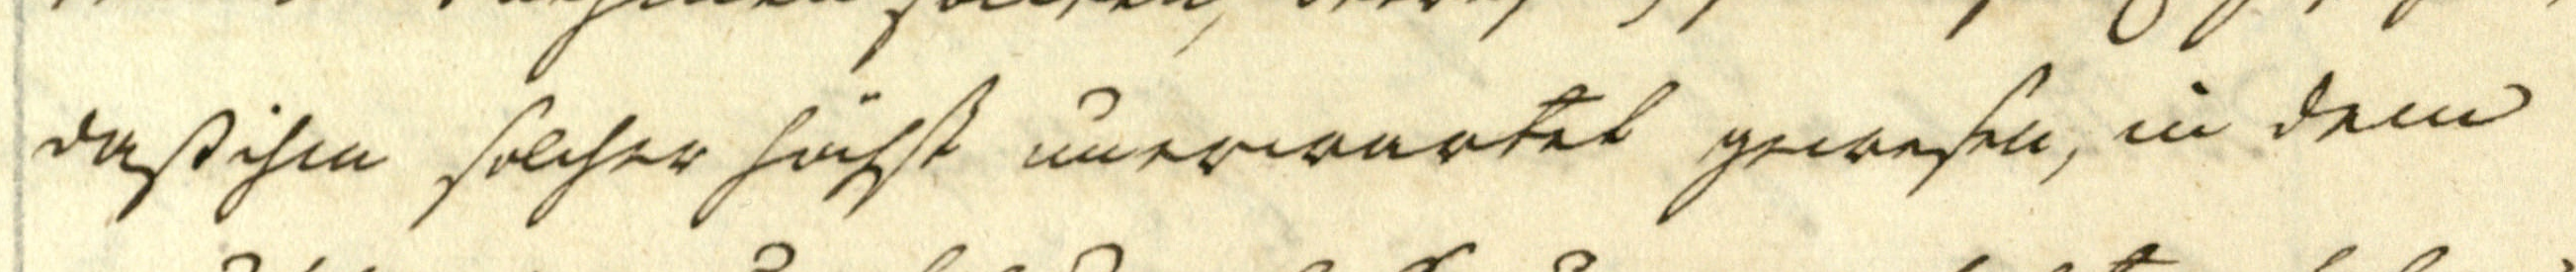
daß ihm solcher höchst unerwartet gewesen, in dem
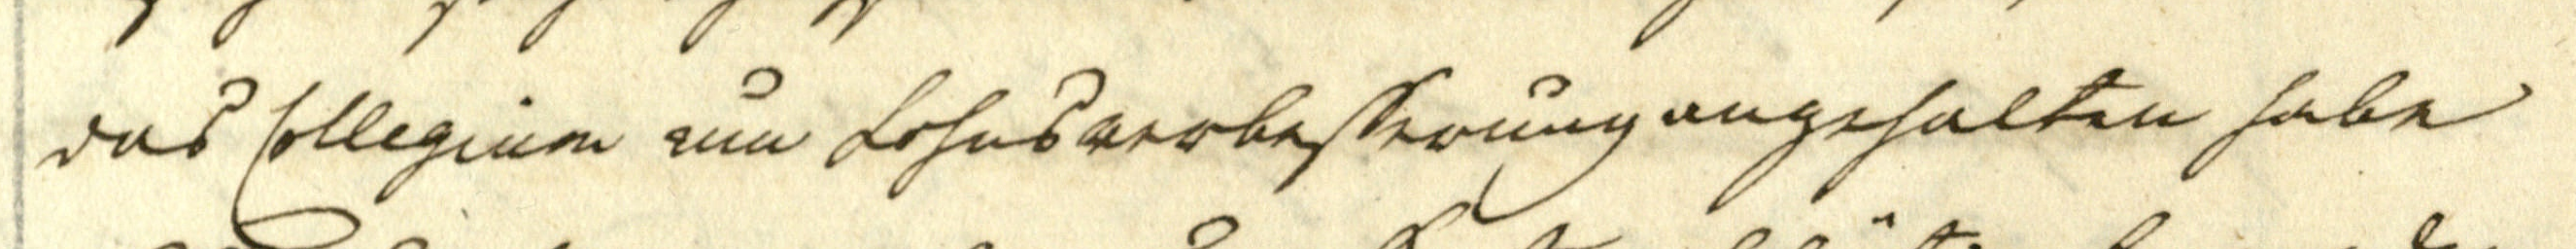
das Collegium um Lohnsverbesserung angehalten habe
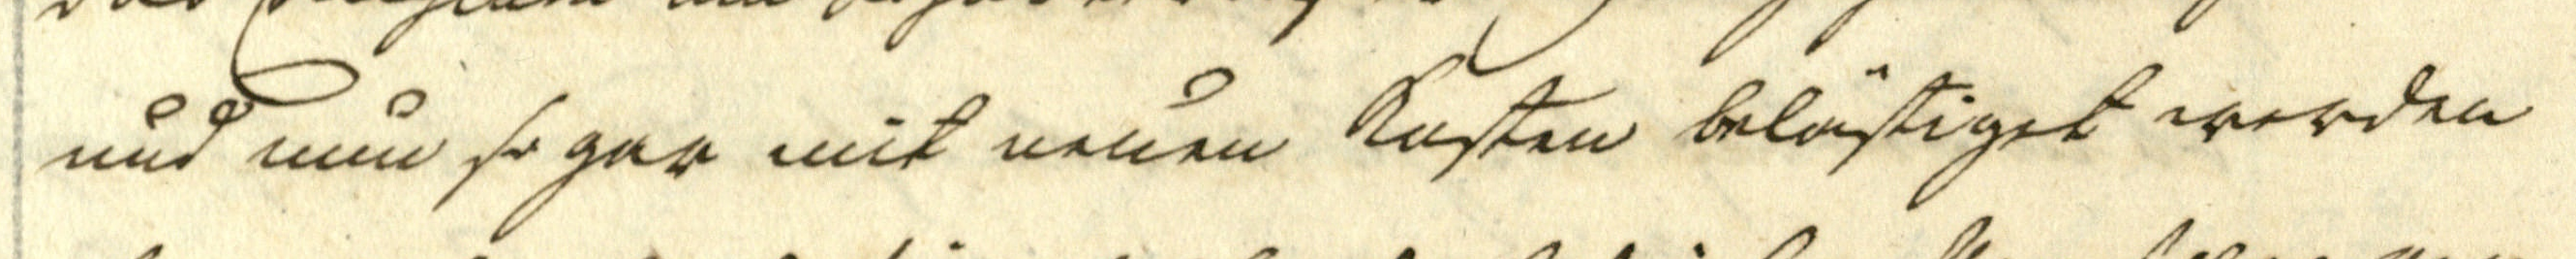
und nun so gar mit neuen Kosten belästiget werden
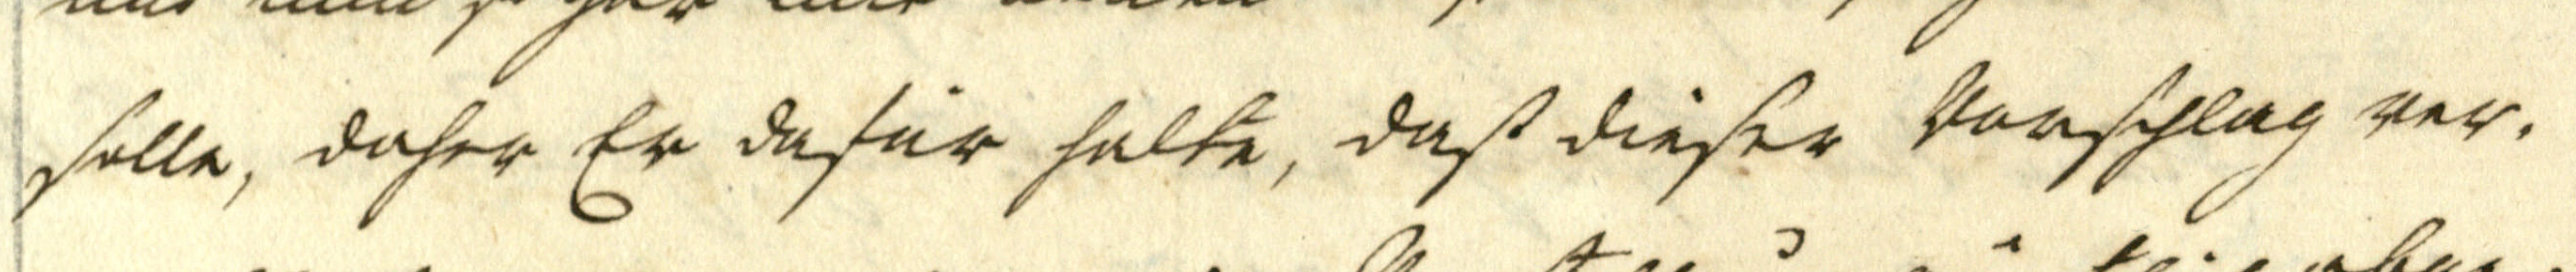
solle, daher Er dafür halte, daß dieser Vorschlag ver¬
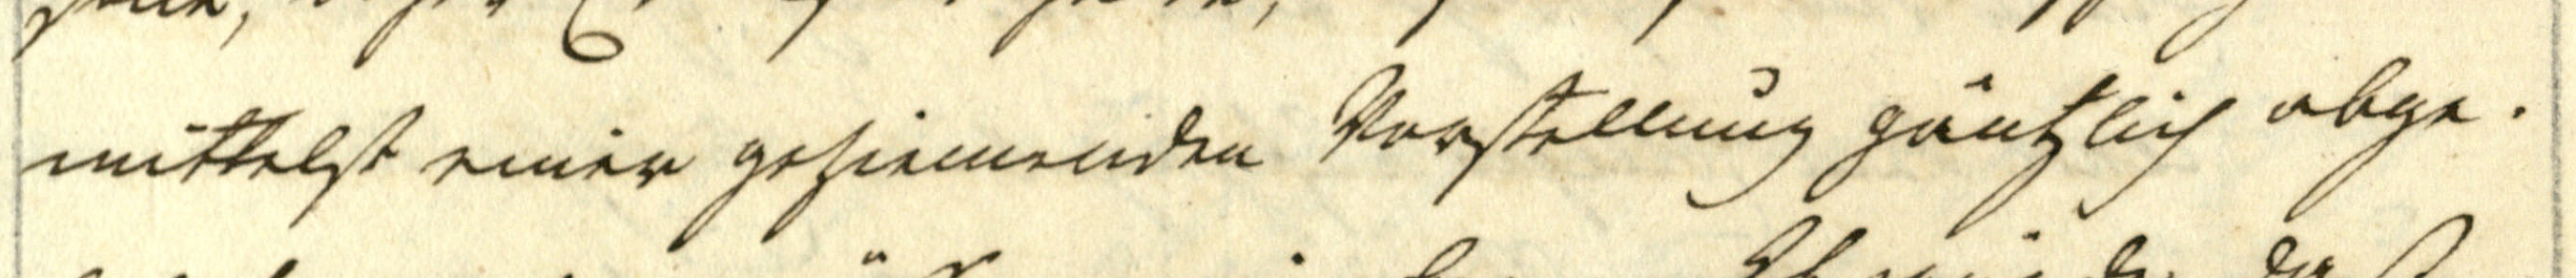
mittelst einer geziemenden Vorstellung gäntzlich abge¬
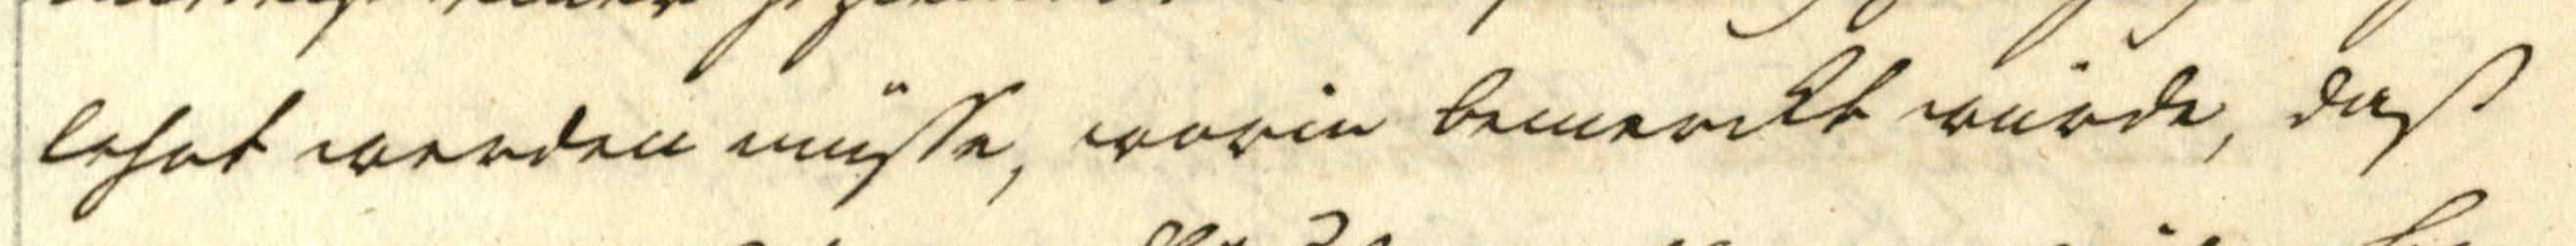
lehnt werden müsse, worin bemerckt würde, daß
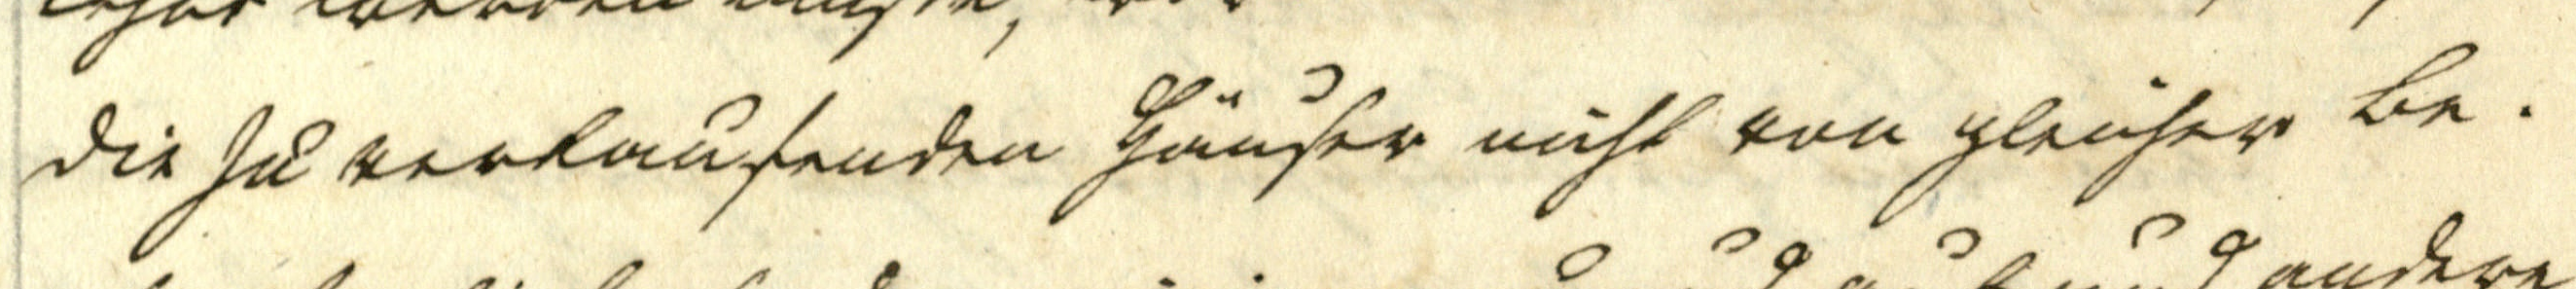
die zu verkaufenden Häuser nicht von gleicher Be¬
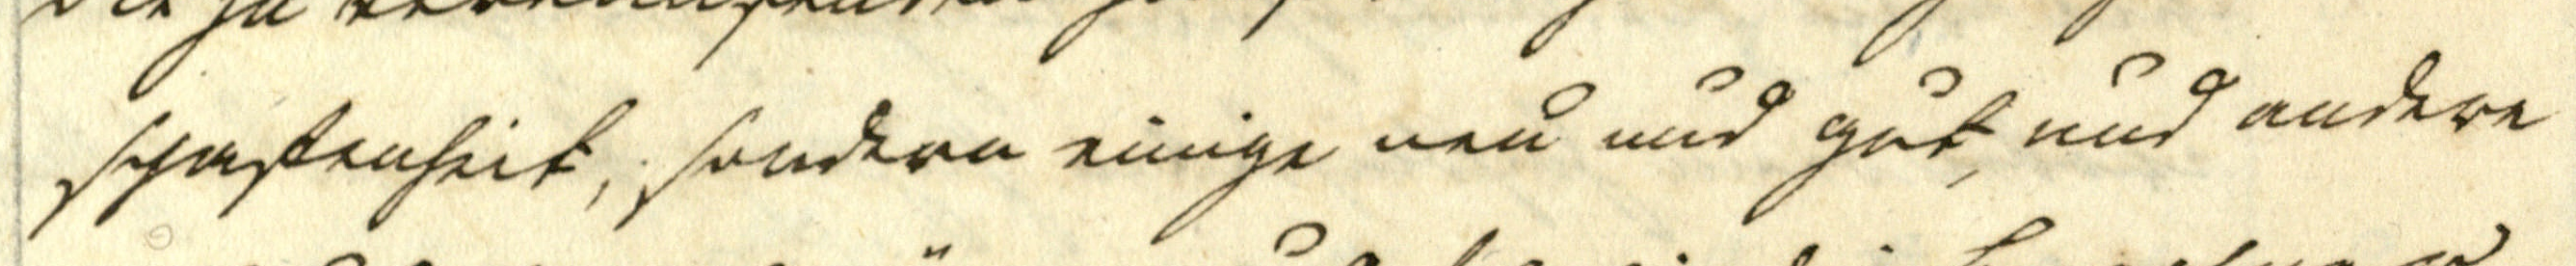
schafenhet, sondern einige neu und gut, und andere
